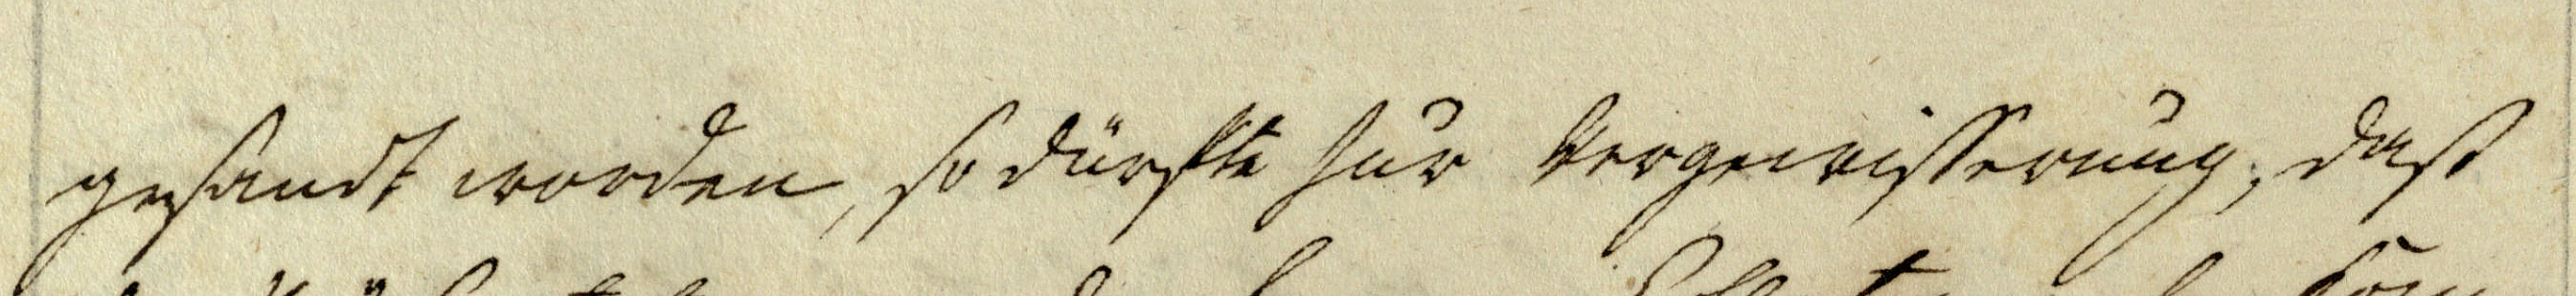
gesandt worden, so dürfte zur Vergewisserung, daß
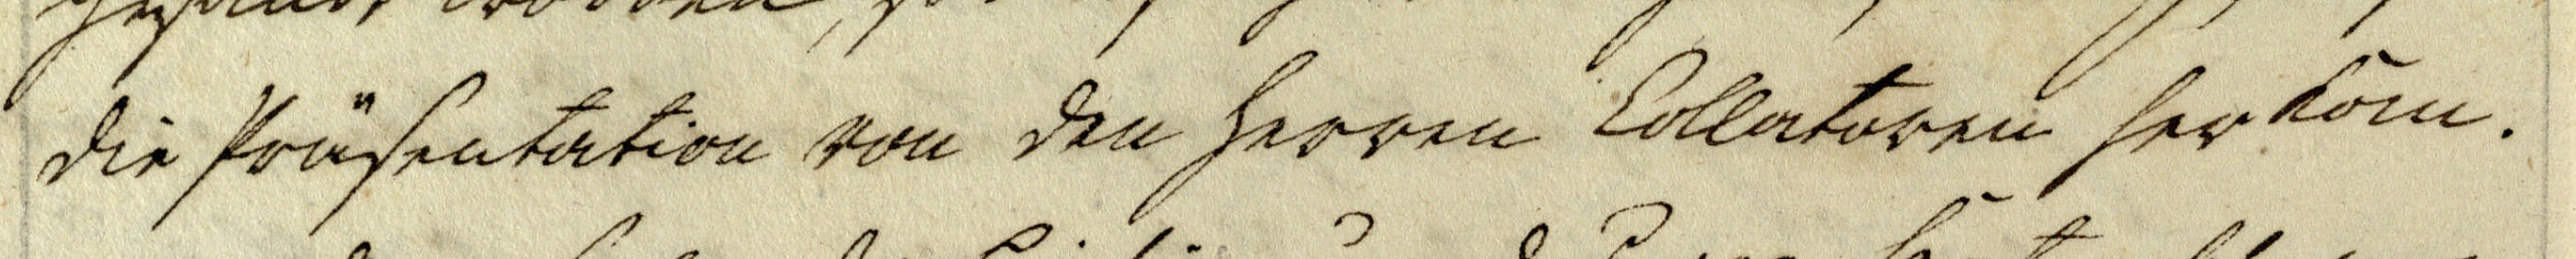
die Präsentation von den Herren Collatoren herkom¬
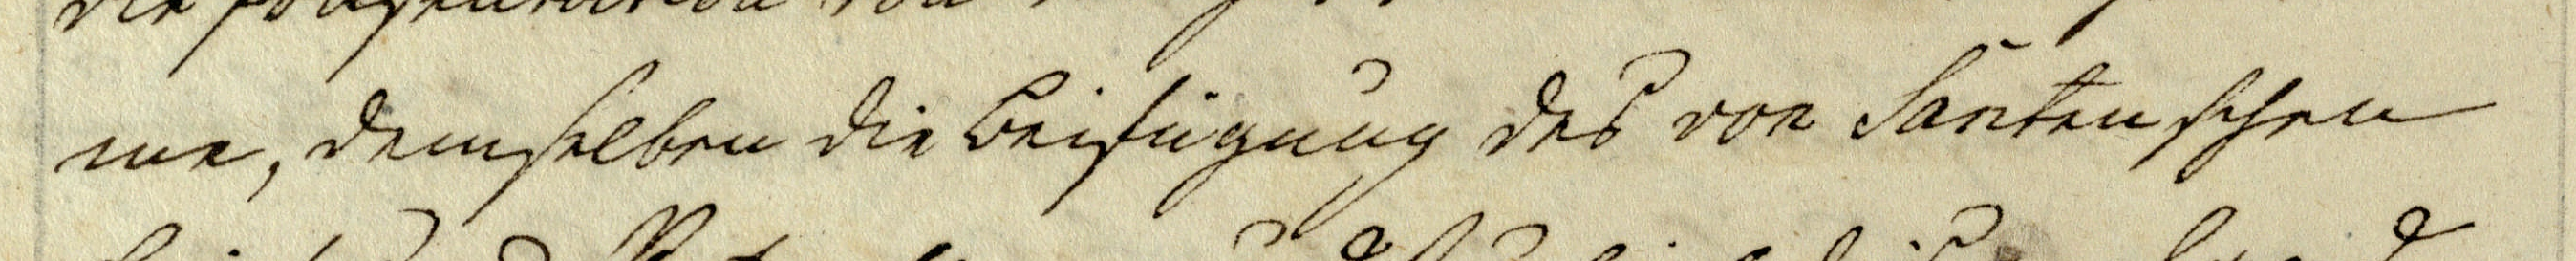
me, demselben die Beifügung des von Santenschen
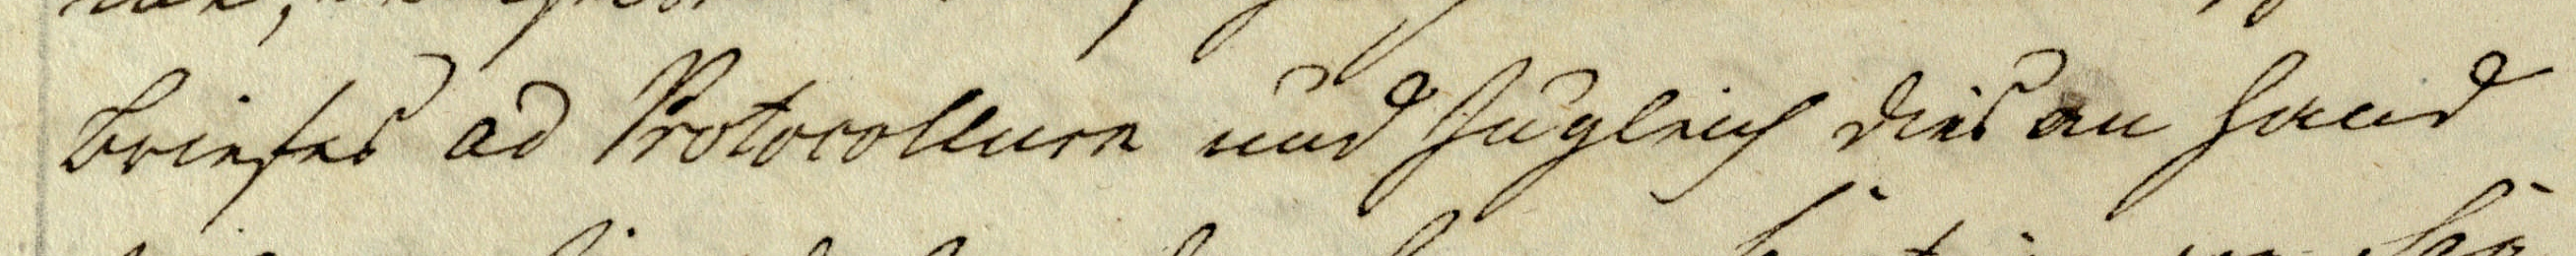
Briefes ad Protocollum und zugleich dies an Hand
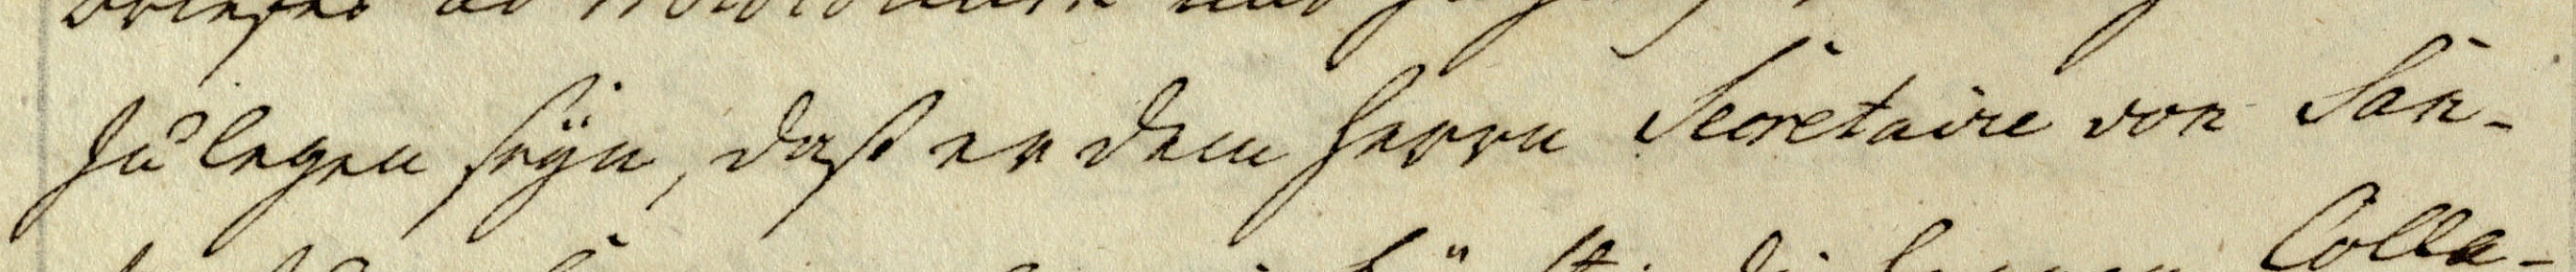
zu legen seÿn, daß er dem Herrn Secretaire von San¬
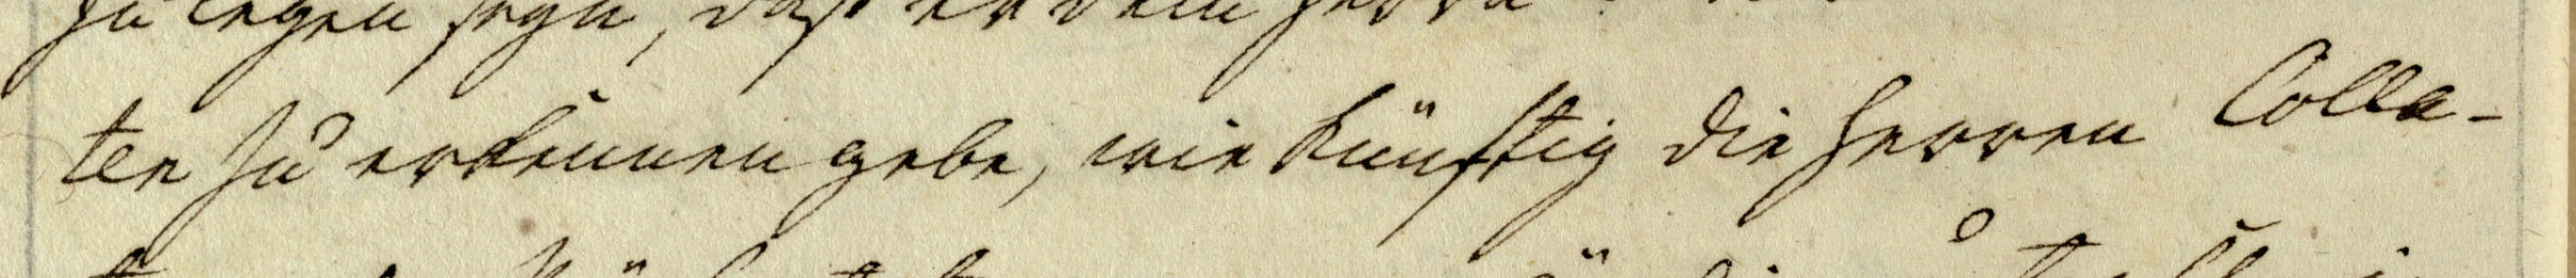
ten zu erkennen gebe, wie künftig die Herren Colla¬
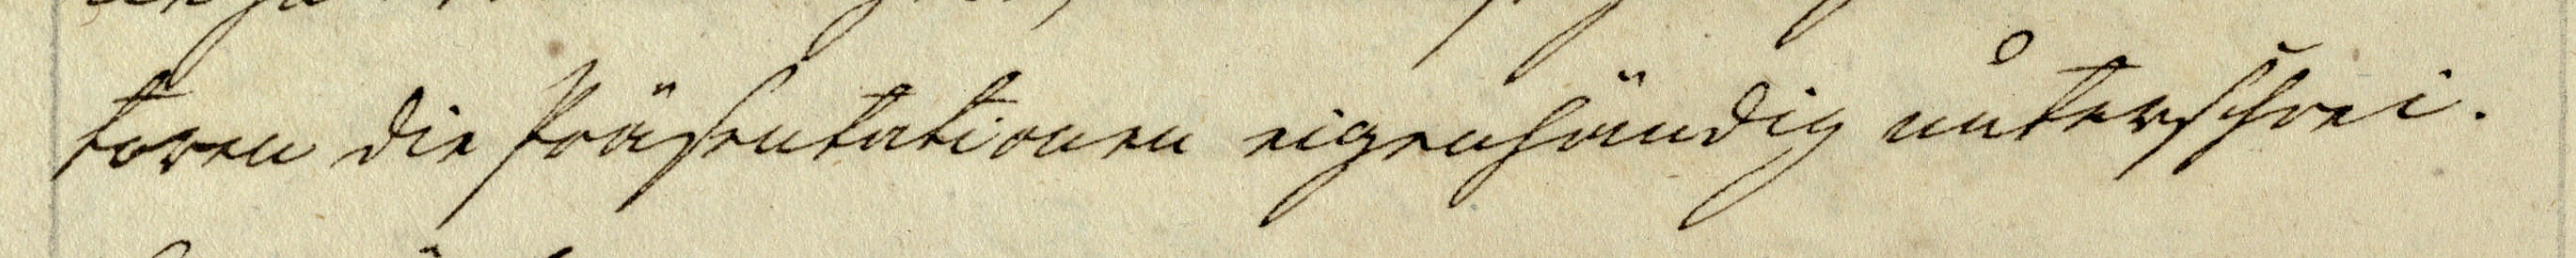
toren die Präsentationen eigenhändig unterschrei¬
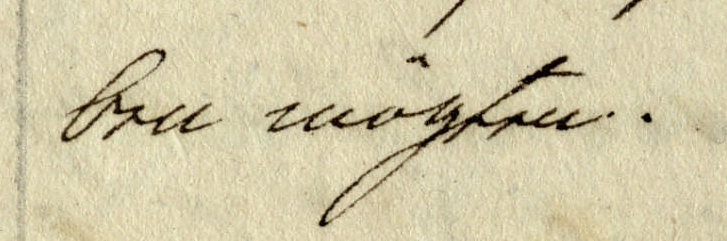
ben mögten.
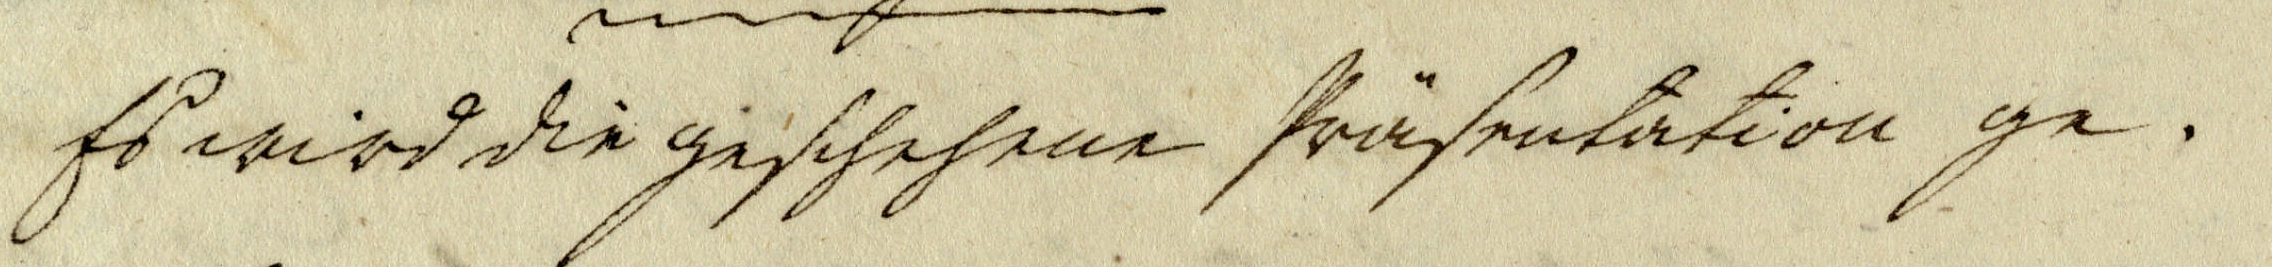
Es wird die geschehene Präsentation ge¬
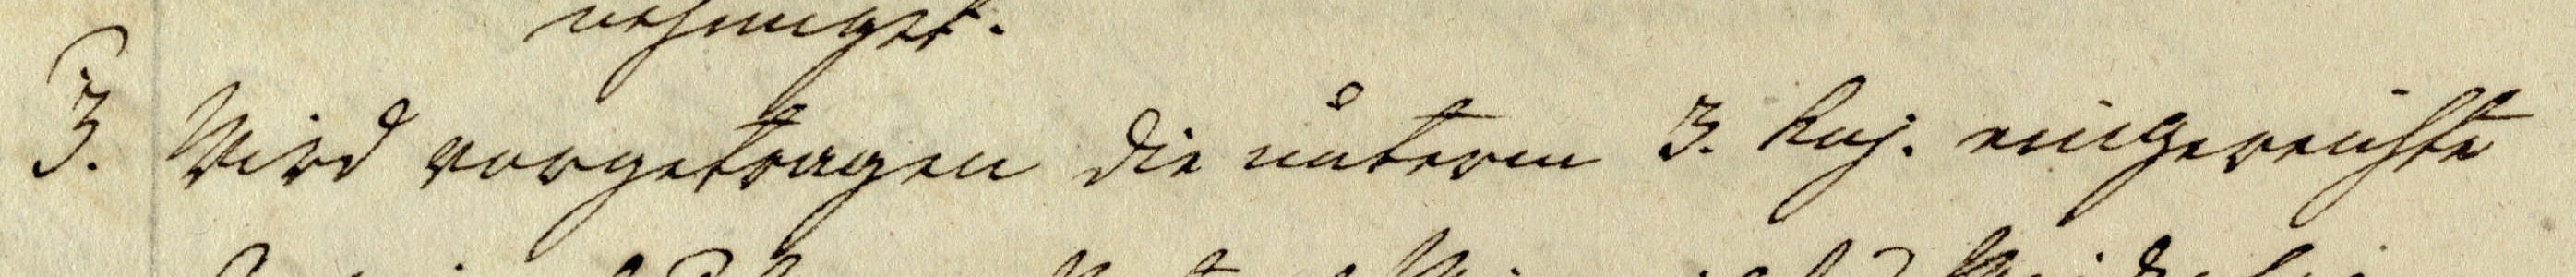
3. Wird vorgetragen die unterm 3. huj. eingereichte
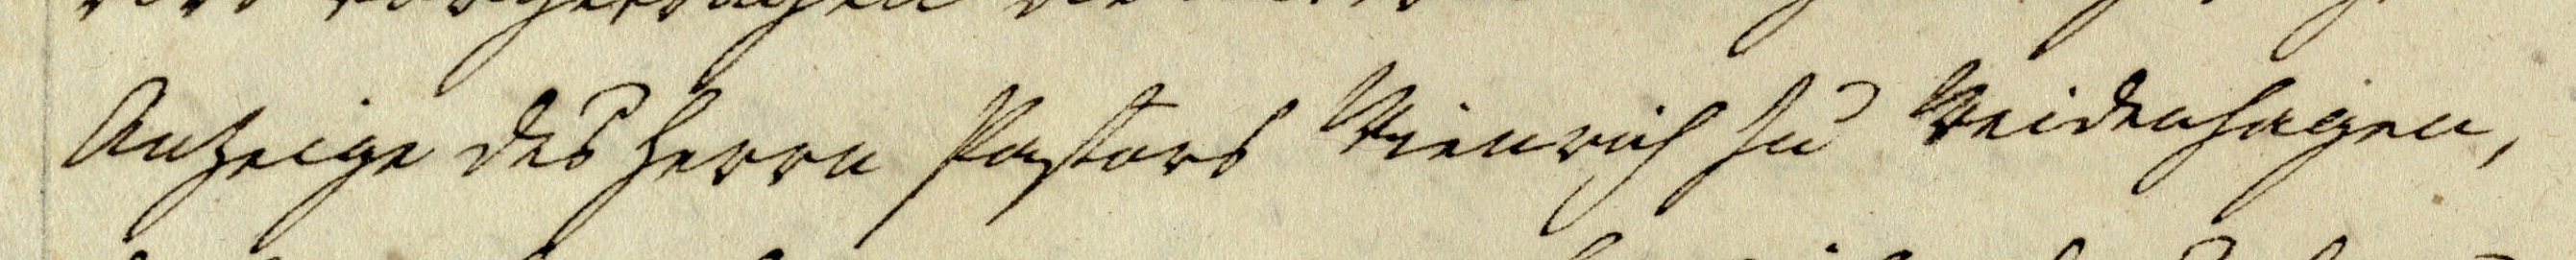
Anzeige des Herrn Pastors Wienrich zu Weidenhagen,
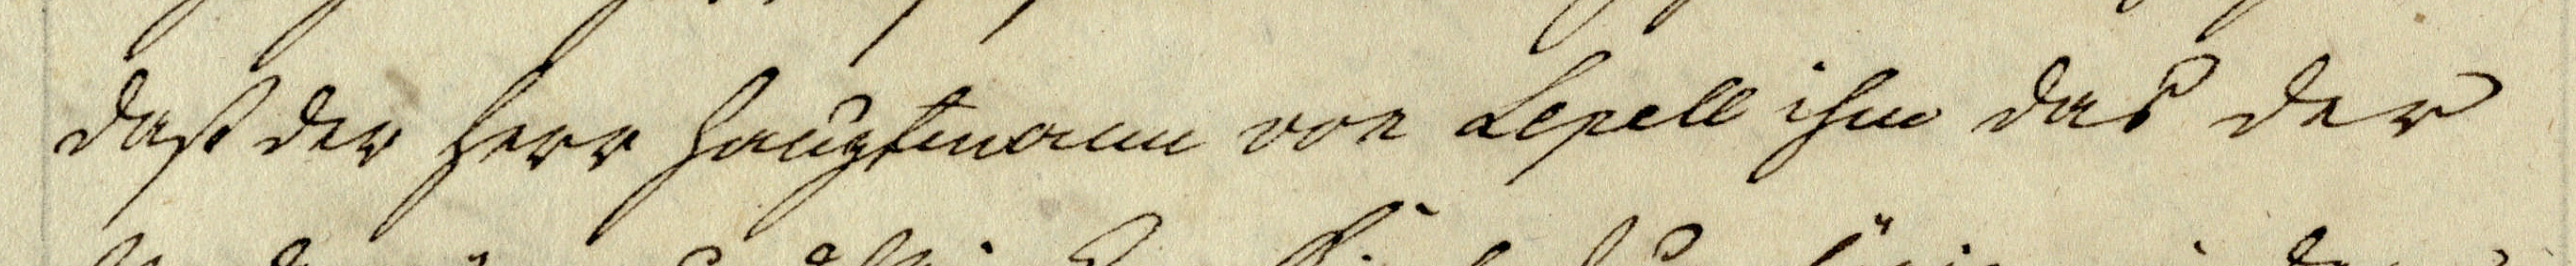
daß der Herr Hauptmann von Lepell ihm das der
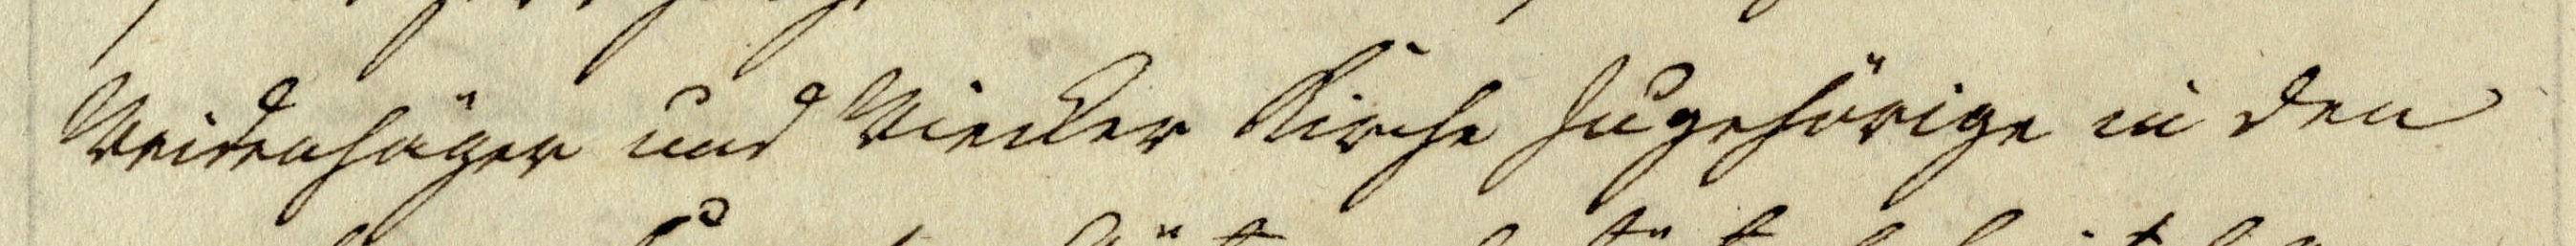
Weidenhäger und Wiecker Kirche zugehörige in den
